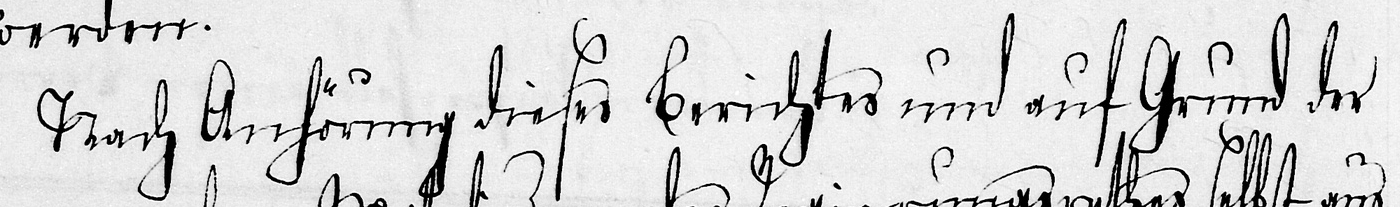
Nach Anhörung dieses Berichtes und auf Grund der
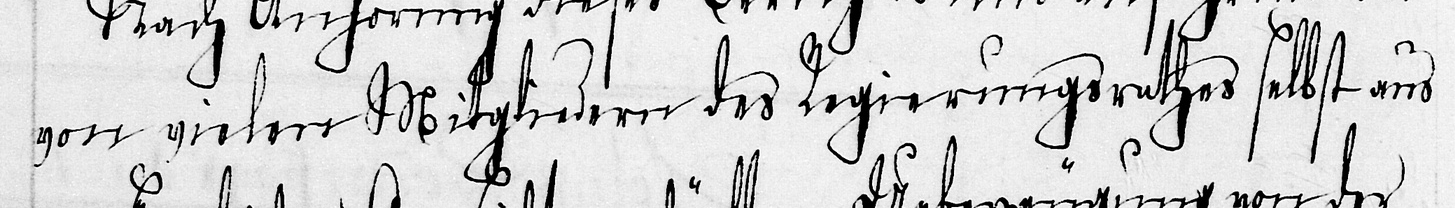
von vielen Mitgliedern des Regierungsrathes selbst aus
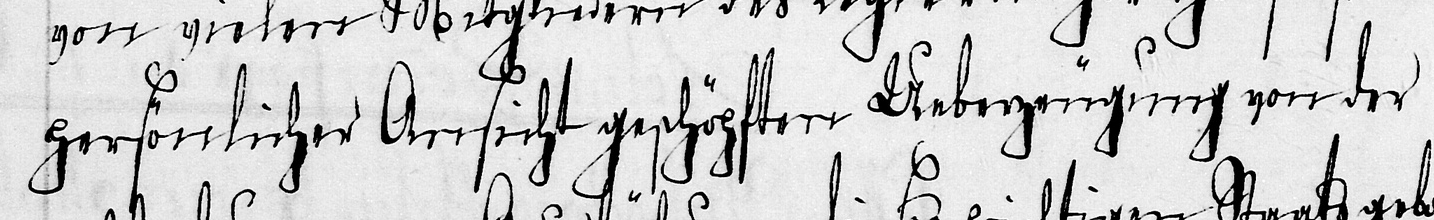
persönlicher Ansicht geschöpften Ueberzeugung von der
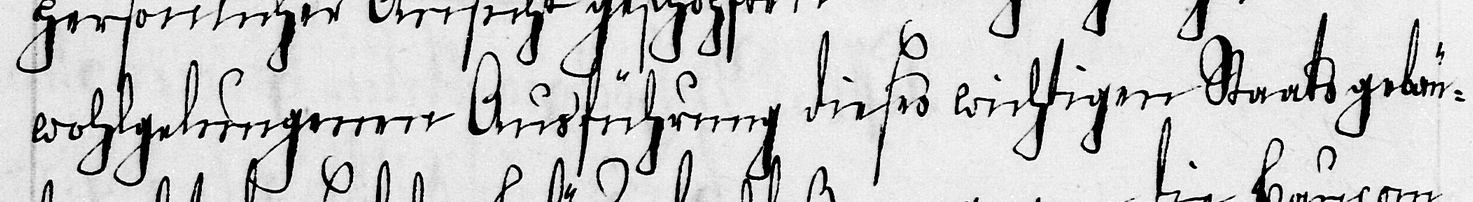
wohlgelungenen Ausführung dieses wichtigen Staatsgebäu¬
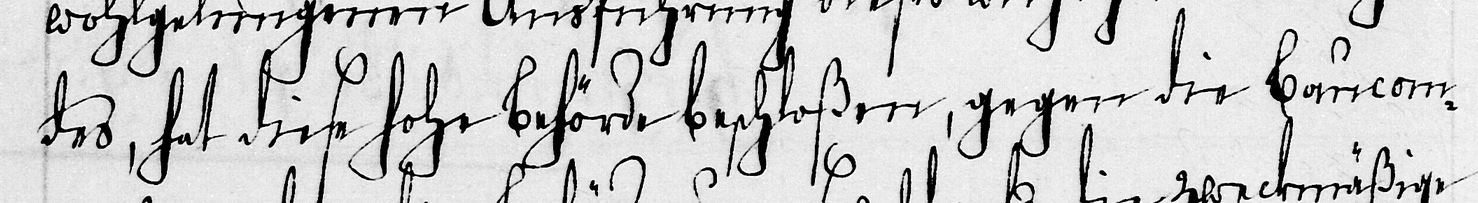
des, hat diese hohe Behörde beschloßen, gegen die Baucom¬
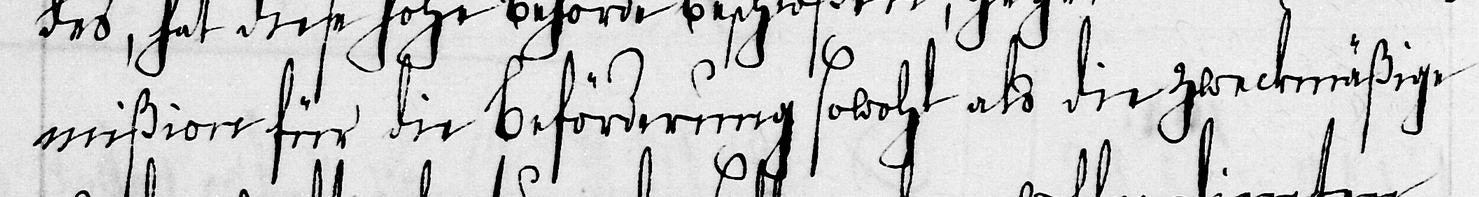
mißion für die Beförderung sowohl als die zweckmäßige
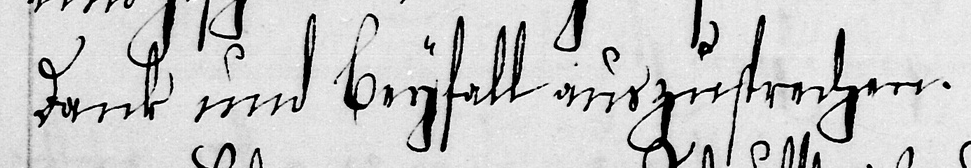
Dank und Beyfall auszusprechen.
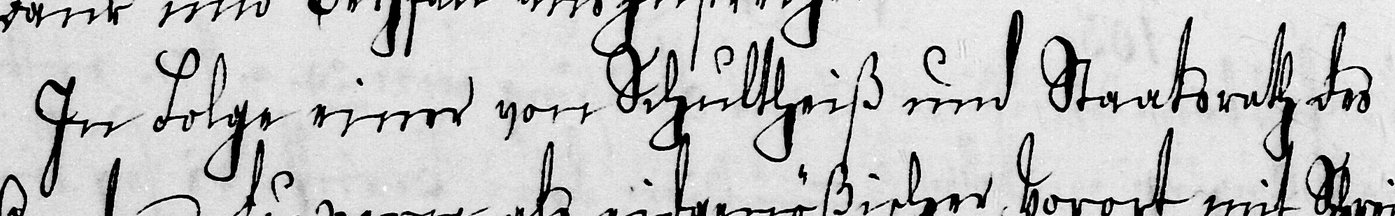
In Folge einer von Schultheiß und Staatsrath des
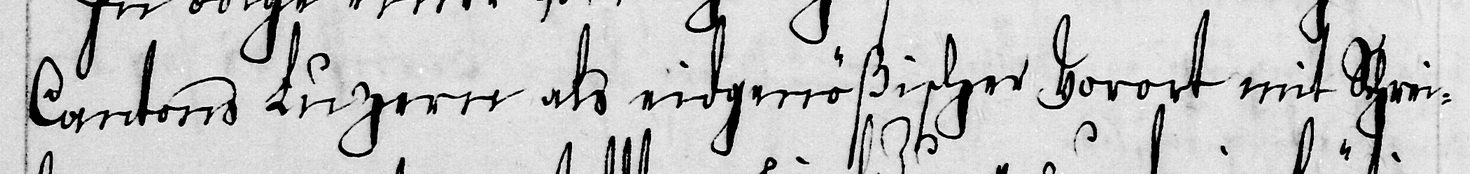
Cantons Luzern als eidgenößischer Vorort mit Schrei¬
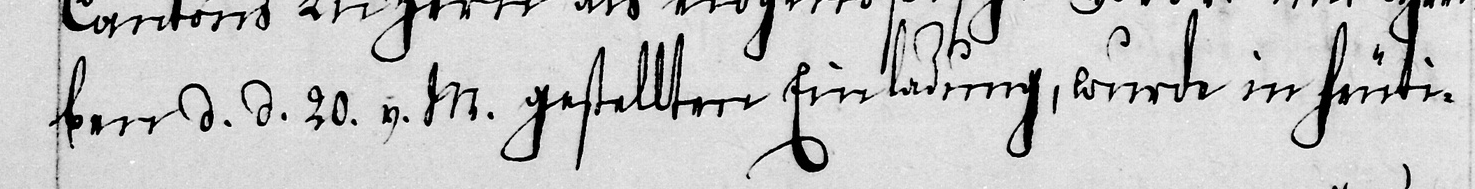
ben d. d. 20. v. M. gestellten Einladung, wurde in heuti-
